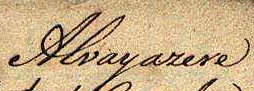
Alvayazere
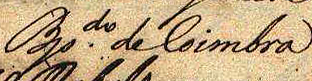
Bp.do de Coimbra
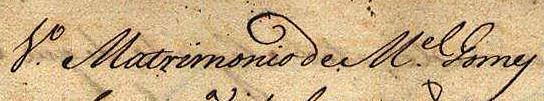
1.o Matrimonio de M.el Gomes
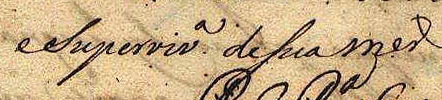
e Superviv.a de sua m.er
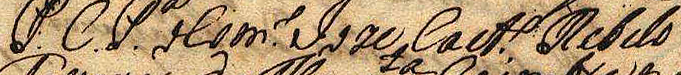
P. C. P.a o Com.o Ioze Caet.o Rebelo
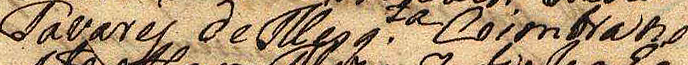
Tavares de Mesq.ta Coimbra no
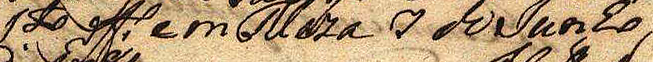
S.to off.o em Meza 7 do Iunho
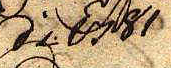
de 1781
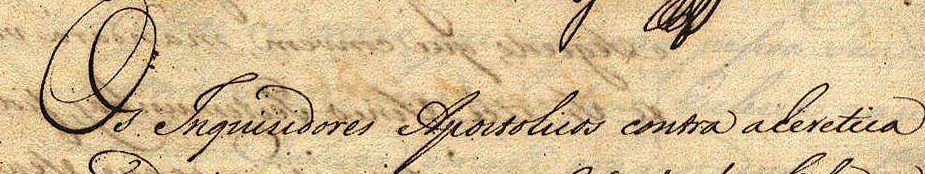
Os Inquizidores Apostolicos contra a heretica
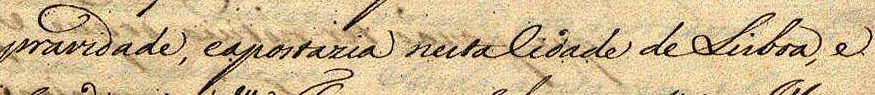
pravidade, e apostazia nesta Cidade de Lisboa, e
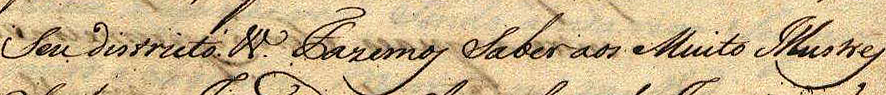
Seu districto &c. Fazemos Saber aos Muito Illustres
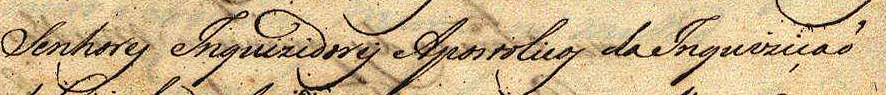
Senhores Inquizidores Apostolicos da Inquiziçaõ
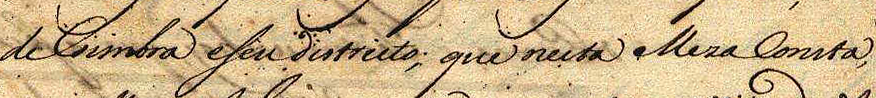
de Coimbra e seu districto; que nesta Meza Consta,
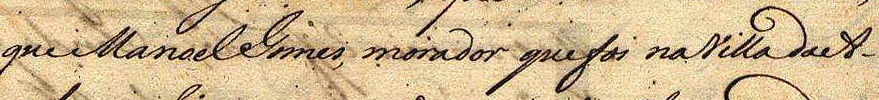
que Manoel Gomes, morador que foi na Villa da A
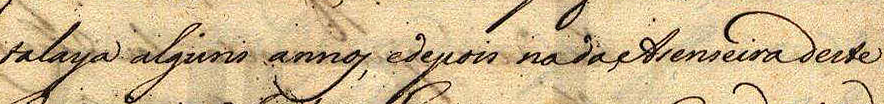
talaya alguns annos, e depois na da Asenseira deste
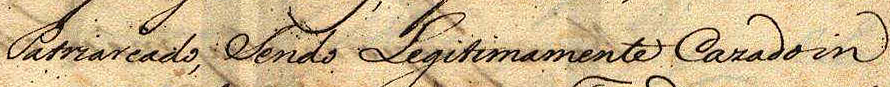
Patriarcado, Sendo Legitimamente Cazado in
